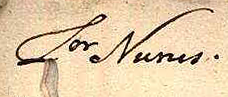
Lor Nunes.
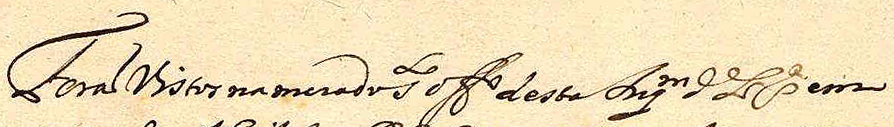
Foraõ vistos na meza do sto offo desta Inq.m de Lixa em
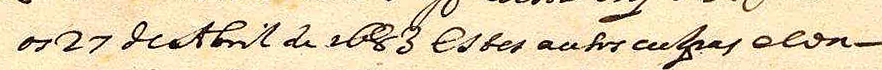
os 27 de Abril de 1683 Estes autos culpas e con
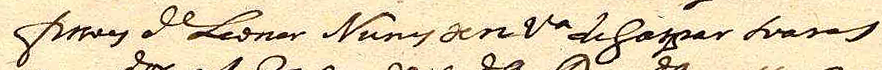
fissoes de Leonor Nunes x n Va de Gaspar soares
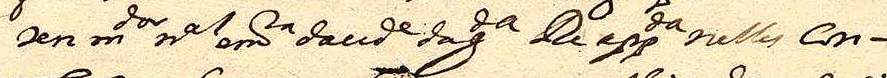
x n mdor nal e mra da cide da gda Re appda nelles con
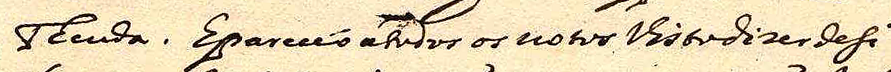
theuda. E pareceo a todos os uotos Visto dizer de si
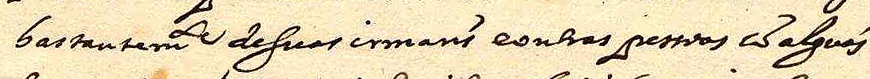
bastantemte de suas irmans̄ e outras pessoas cō alguas̄
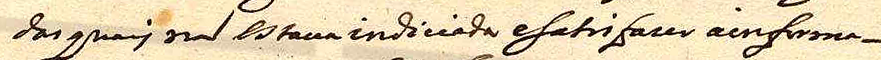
das quais naõ estaua indiciada e satisfazer a informa
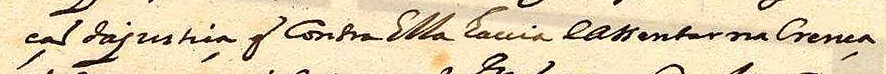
çaõ da justiça q̄ Contra Ella hauia e assentar na Crença
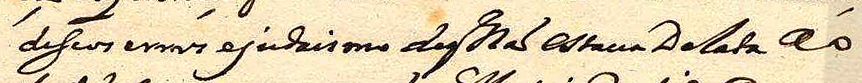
de seos erros e judaismo de q̄ Naõ estaua Delata A
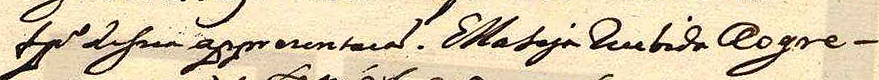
tpo de sua apprezentaçaõ. Ella seja Recebida Ao gre
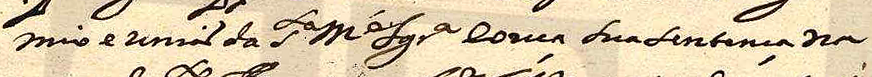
mio, e uniaõ da sta Me Igra e ouça sua sentença na
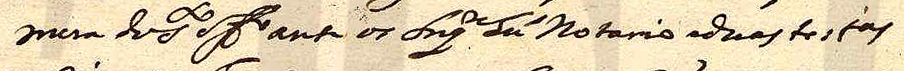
mesa do sto offo ante os Inqres hū Notario e duas testas
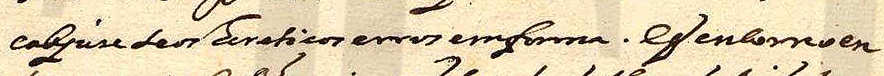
e abjure seos hereticos erros em forma. e q̄ encorreo en
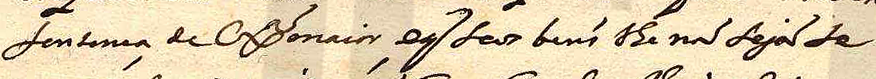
sentença de Exa maior, e q̄ seos bens̄ lhe naõ sejaõ se
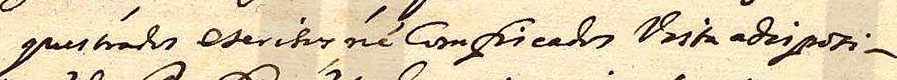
questrados escritos, nē Comfiscados Vista a dispozi
